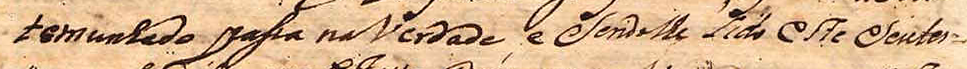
temunhado passa na Verdade, e Sendolhe Lido este seu tes
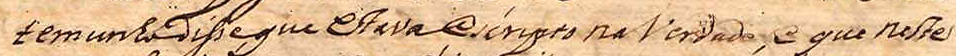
temunho disse, que estava escripto na Verdade, e que nestes
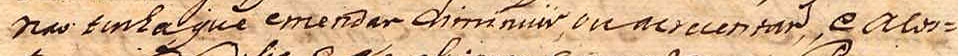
naõ tinha que emendar diminuir, ou acrecentar, e a cos
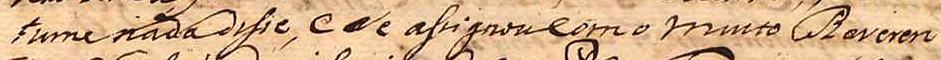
tume nada disse, e se assignou com o muito Reveren
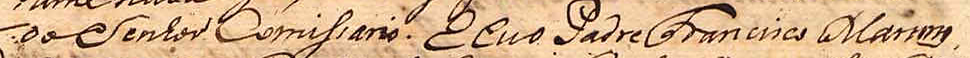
do Senhor Comissario. E Eu o Padre Francisco Martins
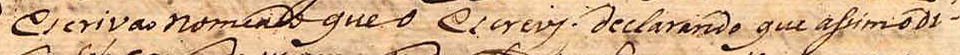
Escrivao nomeado que o escrevj; declarando que assim o di
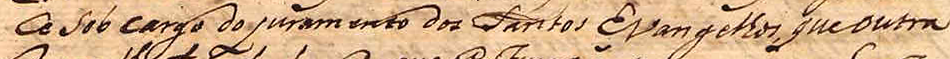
Ce sob cargo do juramento dos Santos Evangelhos, que outra
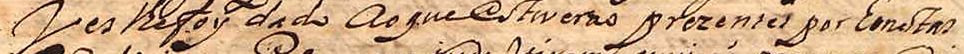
Ves lhe foy dado Ao que estiveraõ prezentes por honestas
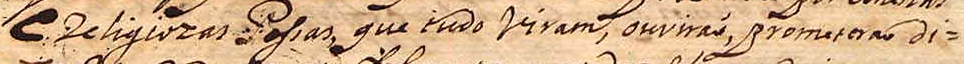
E Religiozas Pesoas, que tudo viram, ouviraõ, prometerao di
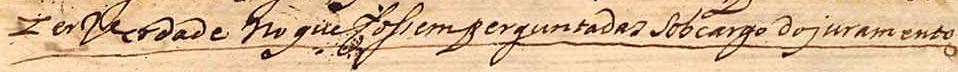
zer Verdade no que fossem perguntadas sob cargo do juramento
